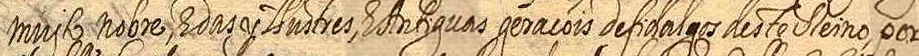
mujto nobre, E das yllustres, E Antiguas geraçõis de fidalgos deste Reino, por
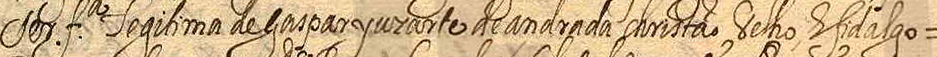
ser f.a legitima de gaspar yuzarte de andrada christão Velho, E fidalgo
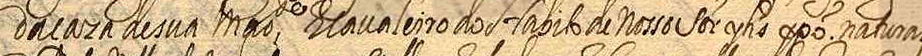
da caza de sua mag.de E caualeiro do Habito de nosso sōr yho xpō natural
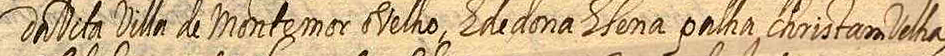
da dita Villa de montemor o Velho, E de dona Elena palha christam Velha,
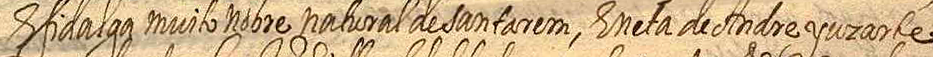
E fidalga muito nobre natural de santarem, E neta de Andre yuzarte
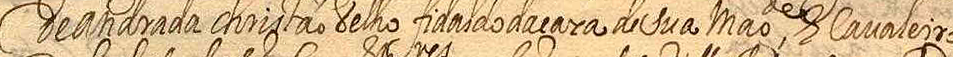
de andrada christão Velho fidaldo da caza de sua Magde, E Caualeiro
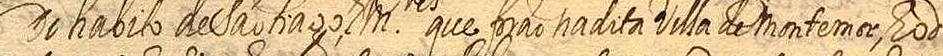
do habito de Saõtiago, E m.res que forão na dita Villa de montemor, E o d.
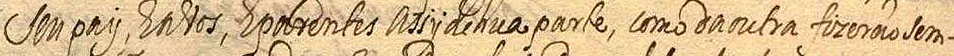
Seu pay, E avos, E parentes assy de hua parte, como da outra fizerão sem
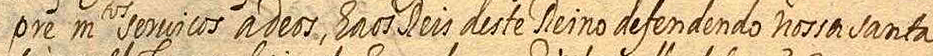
pre mtos seruiços a deos, E aos Reis deste Reino defendendo nossa santa
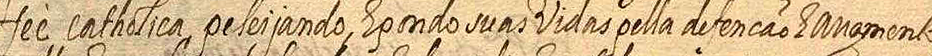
feè catholica, peleijando, E pondo suas Vidas pella defenção E augmento
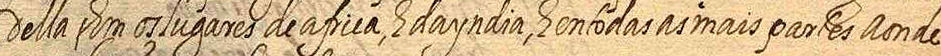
della, Em os lugares de africa, E da yndia, E en todas as mais partes aonde
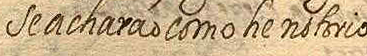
se acharaõ como he notorio
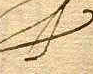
P.a
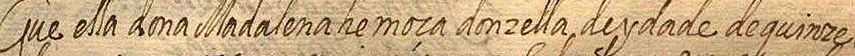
Que ella dona Madalena he moça donzella de ydade de quinze
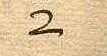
2
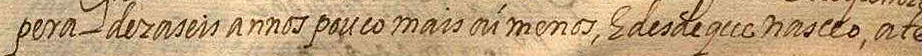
pera dezaseis annos pouco mais ou menos, E desde que nasceo, ate
